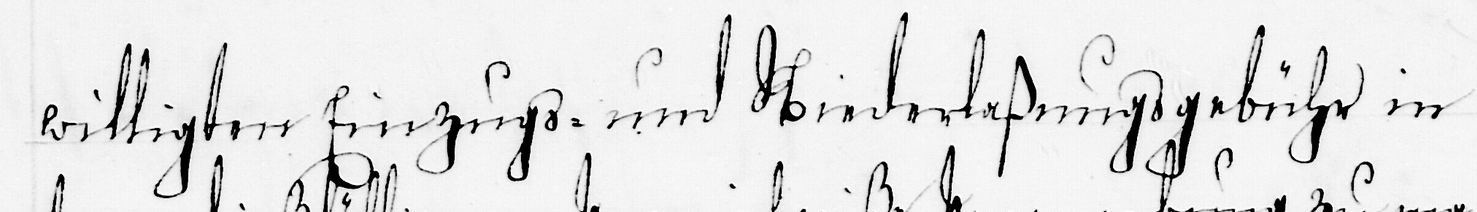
willigten Einzugs- und Niederlaßungsgebühr in
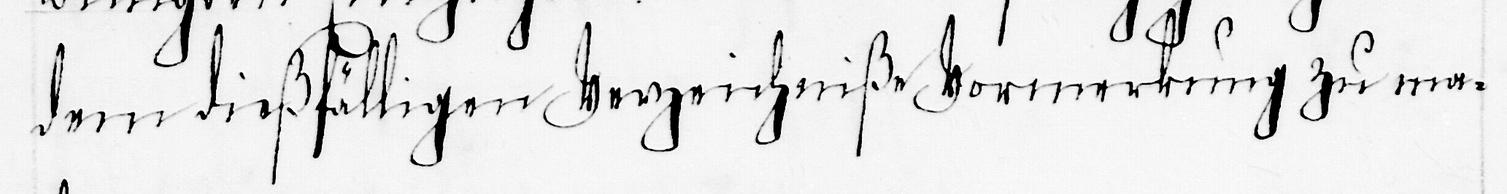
dem dießfälligen Verzeichniße Vormerkung zu ma¬
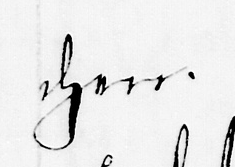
chen.
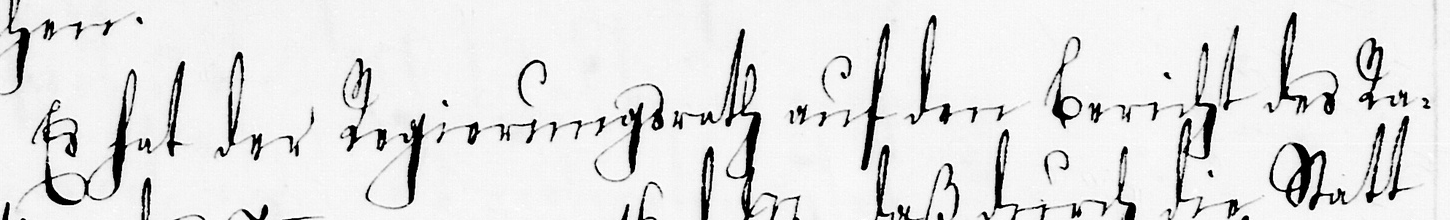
Es hat der Regierungsrath auf den Bericht des Ra¬
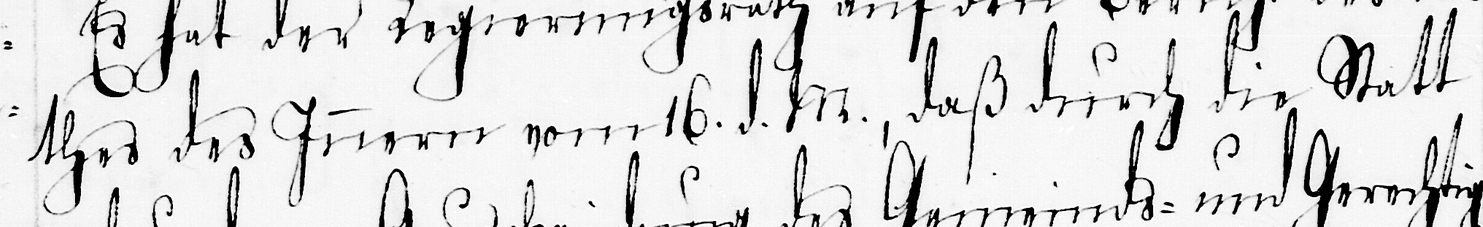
thes des Innern vom 16. d. M., daß durch die Statt
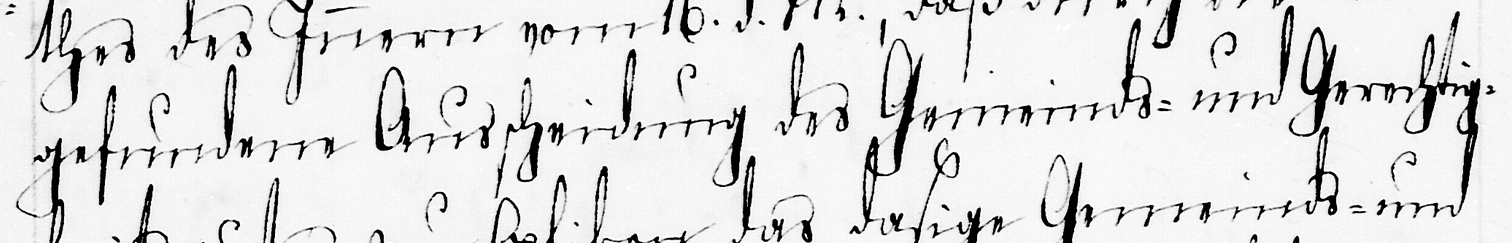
gefundene Ausscheidung des Gemeinds- und Gerechti¬
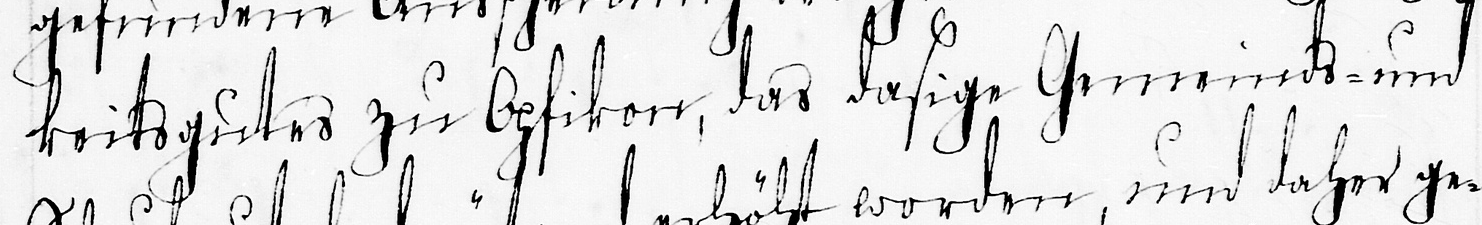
gkeitsgutes zu Opfikon, das dasige Gemeinds- und
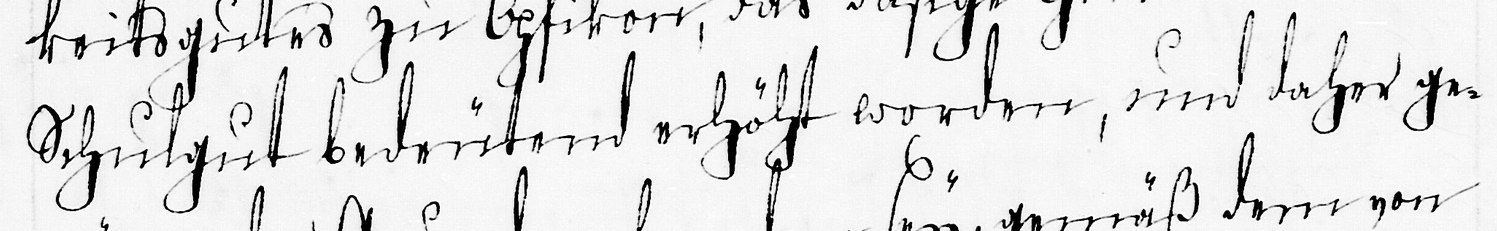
Schulgut bedeutend erhöht worden, und daher ge¬
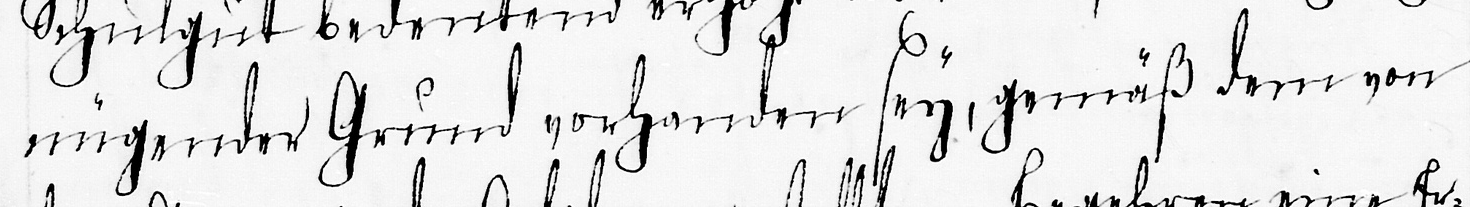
nügender Grund vorhanden sey, gemäß dem von
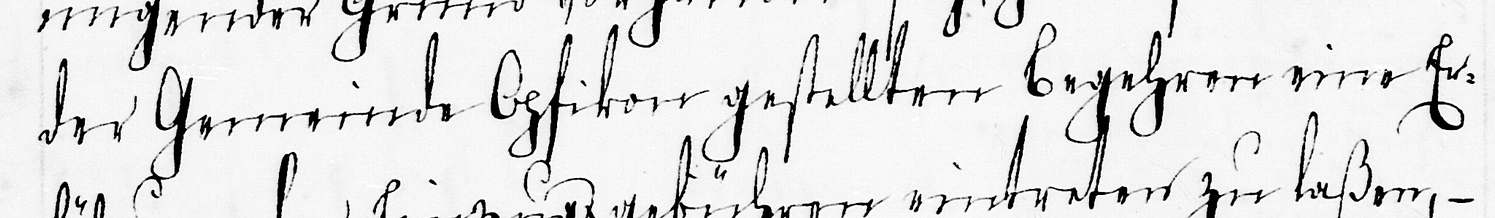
der Gemeinde Opfikon gestellten Begehren eine Er¬
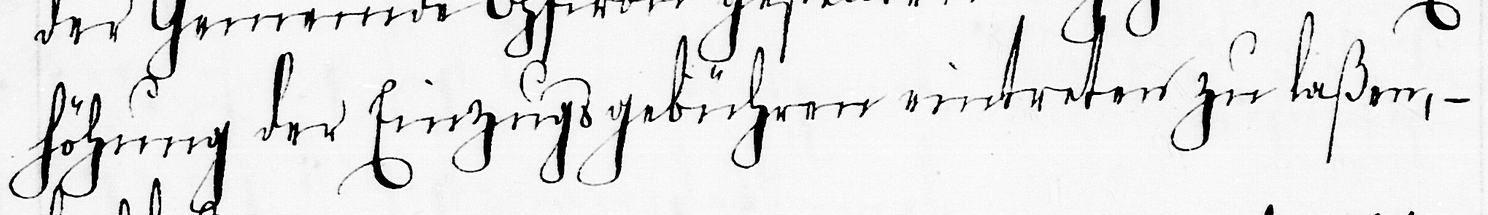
höhung der Einzugsgebühren eintreten zu laßen, –
